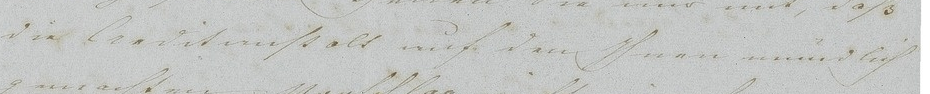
die Creditanstalt auf den Ihnen mündlich
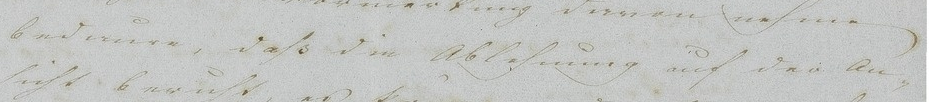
bedaure, daß die Ablehnung auf der An-
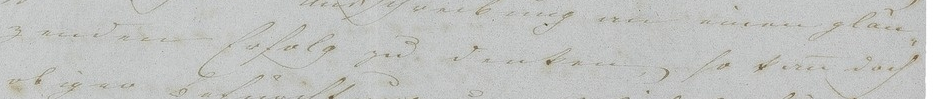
zenden Erfolg zu denken, so kann doch
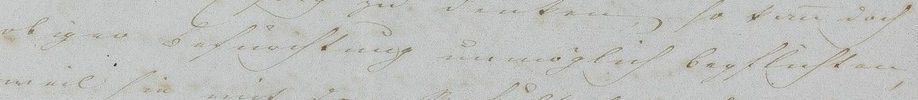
obiger Befürchtung unmöglich beipflichten,
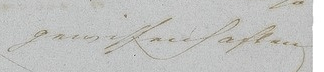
gewissenhaften
